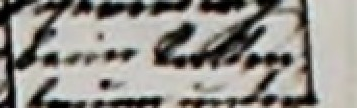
beim Kallen
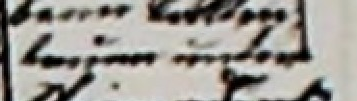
bauer unter
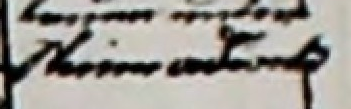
Stein???
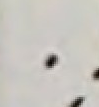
„
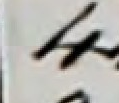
4
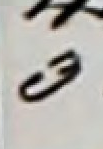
3
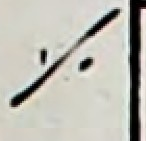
./.
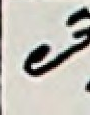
3
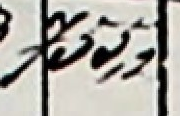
755,2
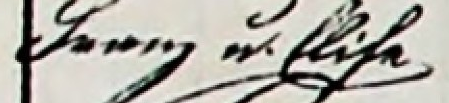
Franz u. Elise
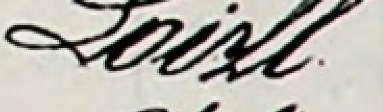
Loizl
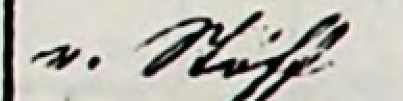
v. Stoff
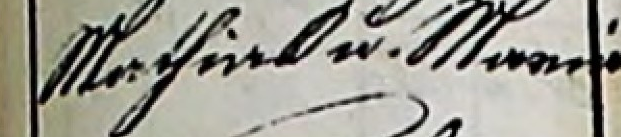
Mathias u. Maria
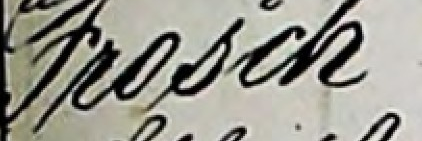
Fosch
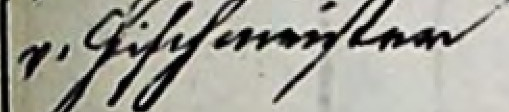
v. Fischmeister
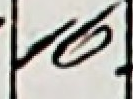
16
